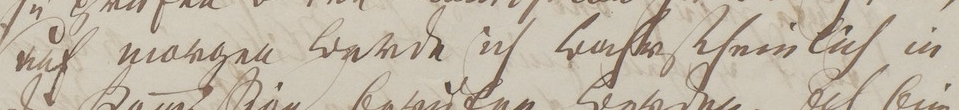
auf morgen werde ich wahrscheinlich in
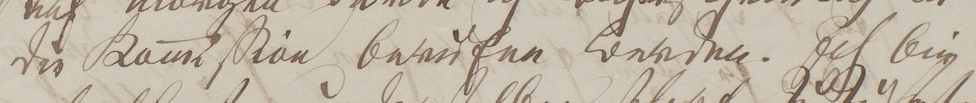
die Kommission berufen werden. Ich bin
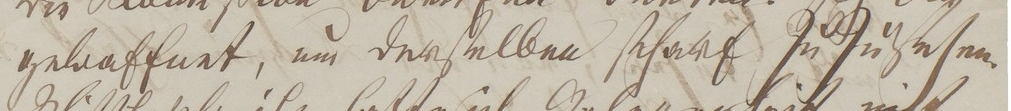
gewaffnet, um derselben scharf zuzusezen.
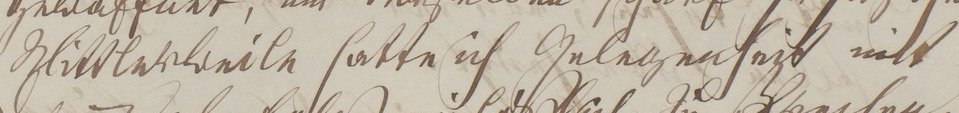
Mittlerweile hatte ich Gelegenheit mit
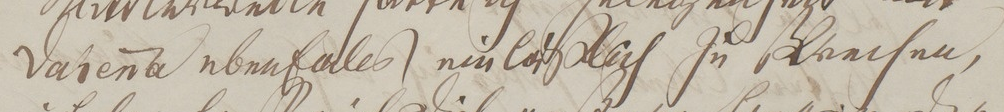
Varenna ebenfalls einläßlich zu sprechen,
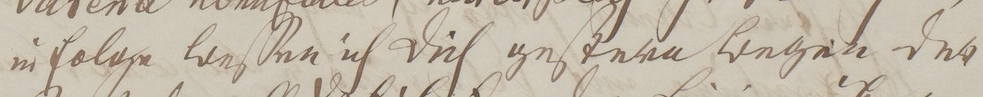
in Folge wessen ich Dich gestern wegen der
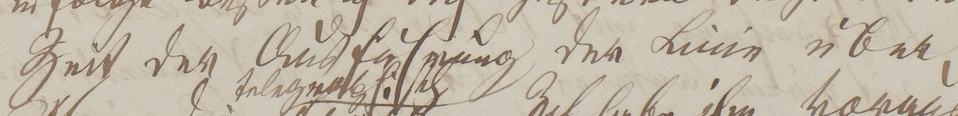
Zeit der Ausführung der Linie über
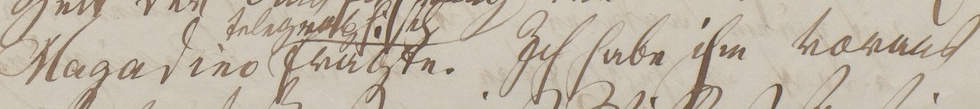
telegraphisch fragte. Ich habe ihm voraus
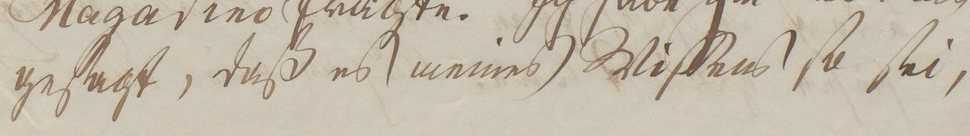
gesagt, daß es meines Wissens so sei,
